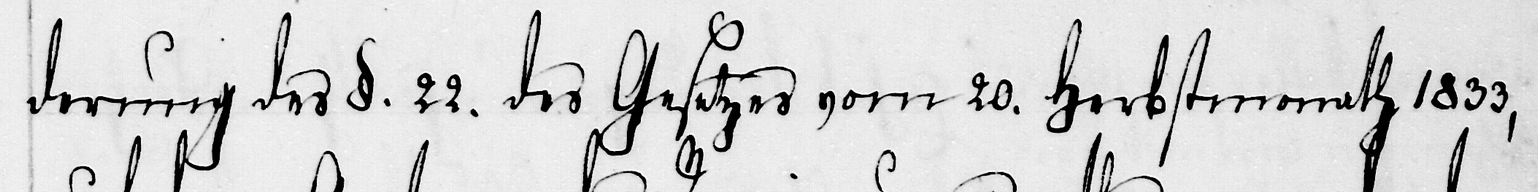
derung des §. 22. des Gesetzes vom 20. Herbstmonath 1833,
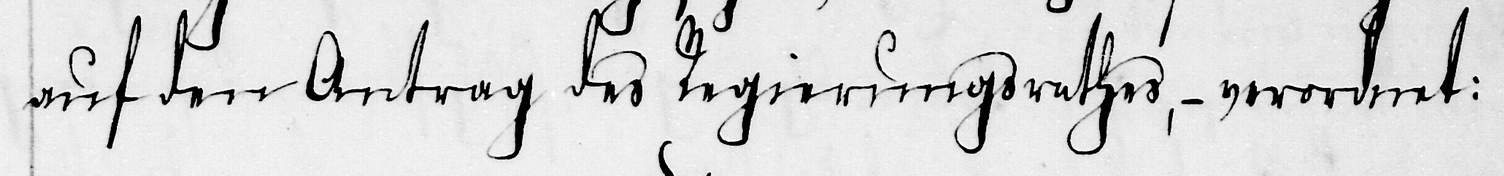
auf den Antrag des Regierungsrathes, – verordnet:
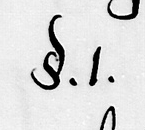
§. 1.
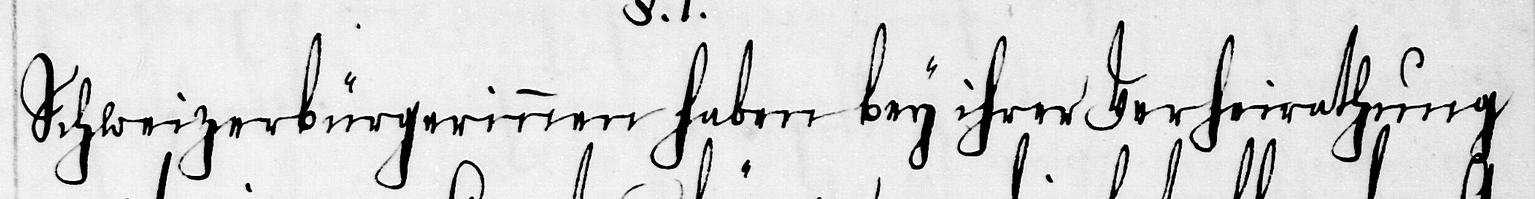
Schweizerbürgerinnen haben bey ihrer Verheirathung
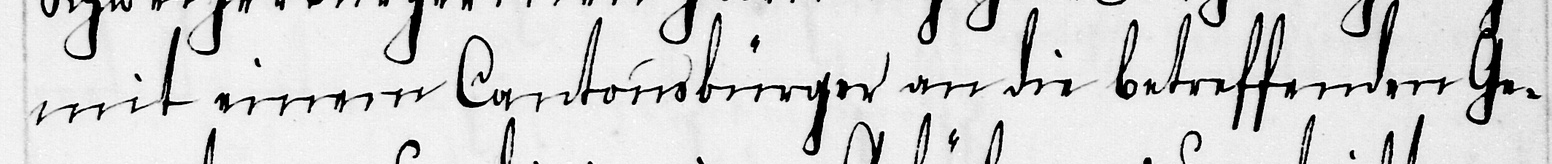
mit einem Cantonsbürger an die betreffenden Ge¬
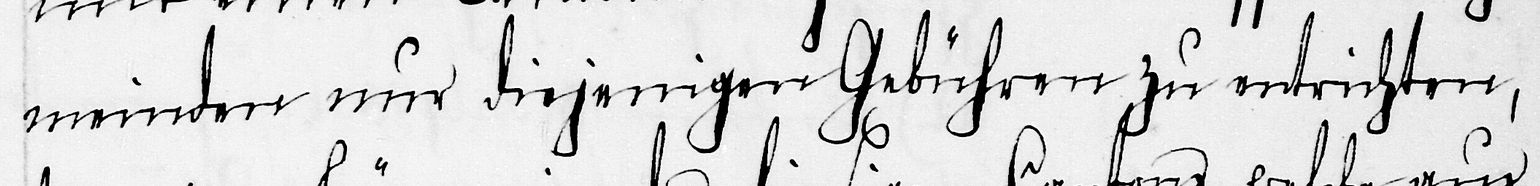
meinden nur diejenigen Gebühren zu entrichten,
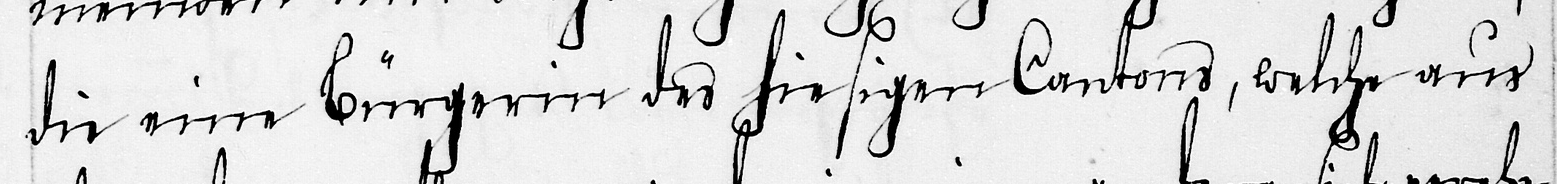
die eine Bürgerin des hiesigen Cantons, welche aus
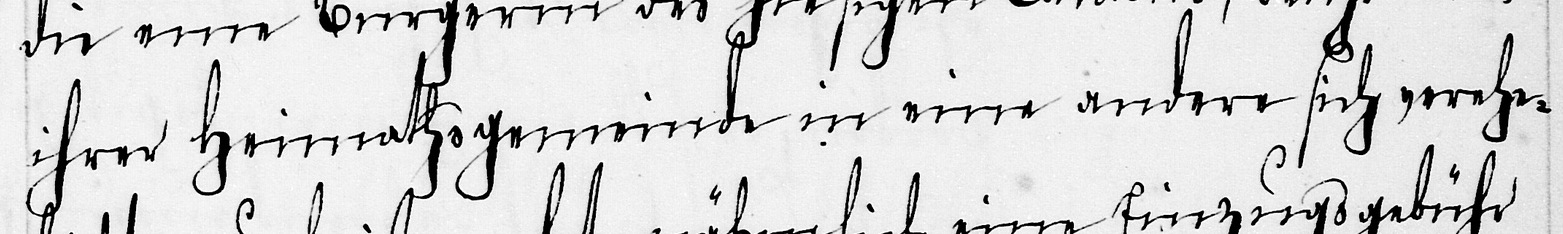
ihrer Heimathsgemeinde in eine andere sich verehe¬
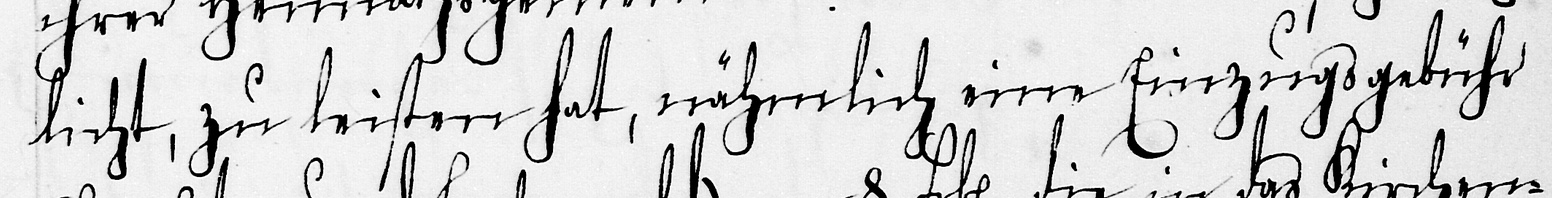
licht, zu leisten hat, nähmlich eine Einzugsgebühr
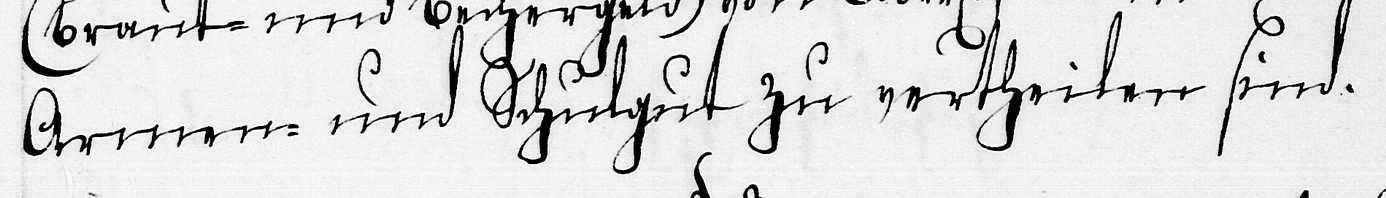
Armen- und Schulgut zu vertheilen sind.
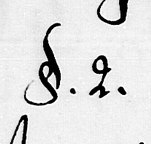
§. 2.
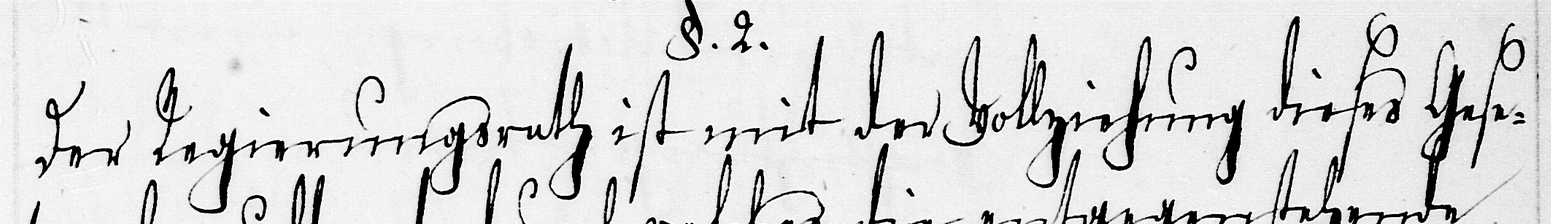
Der Regierungsrath ist mit der Vollziehung dieses G¬
